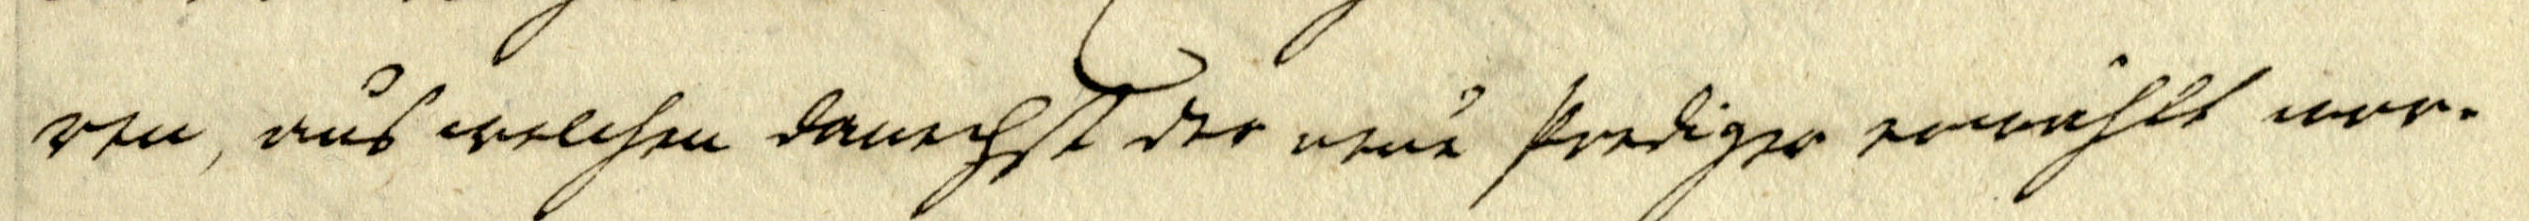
ren, aus welchen danechst der neue Prediger erwählt wor¬
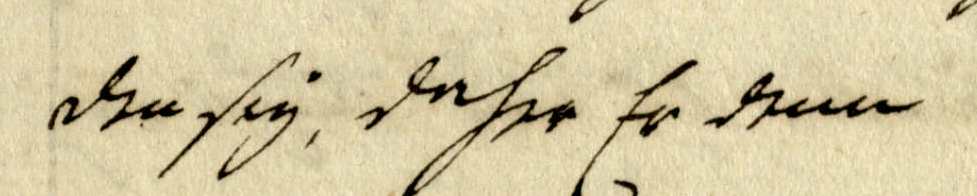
den seÿ, daher Er denn
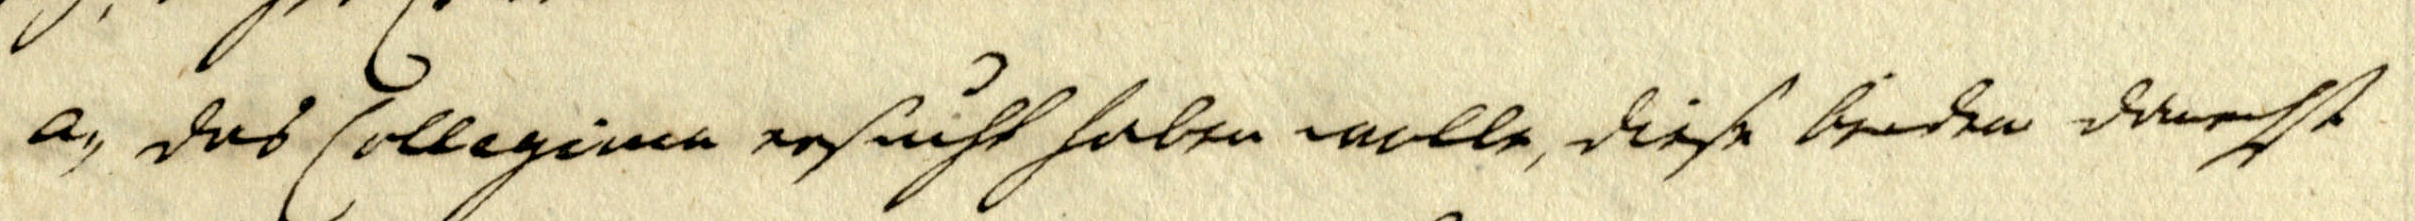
a, das Collegium ersucht haben wolle, diese beiden danechst
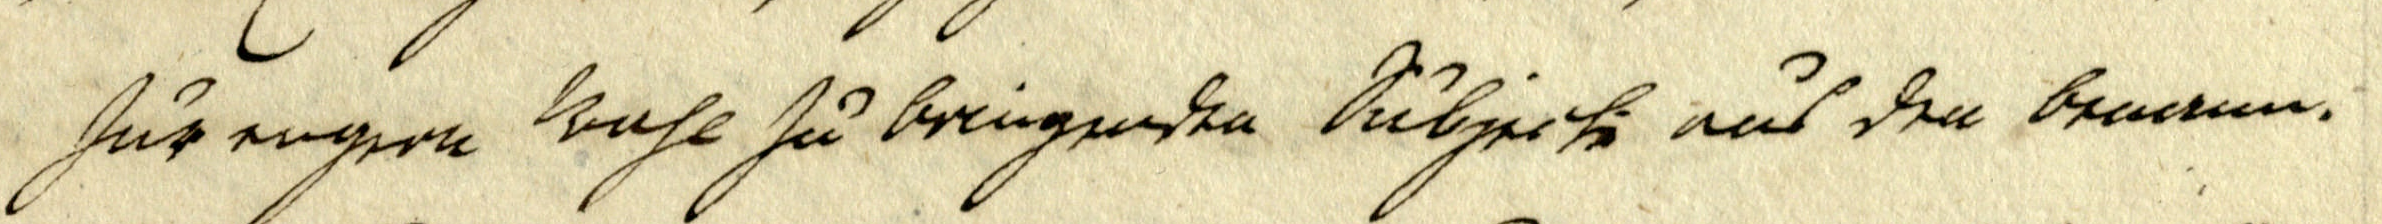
zur engern Wahl zu bringenden Subjecte aus den benann¬
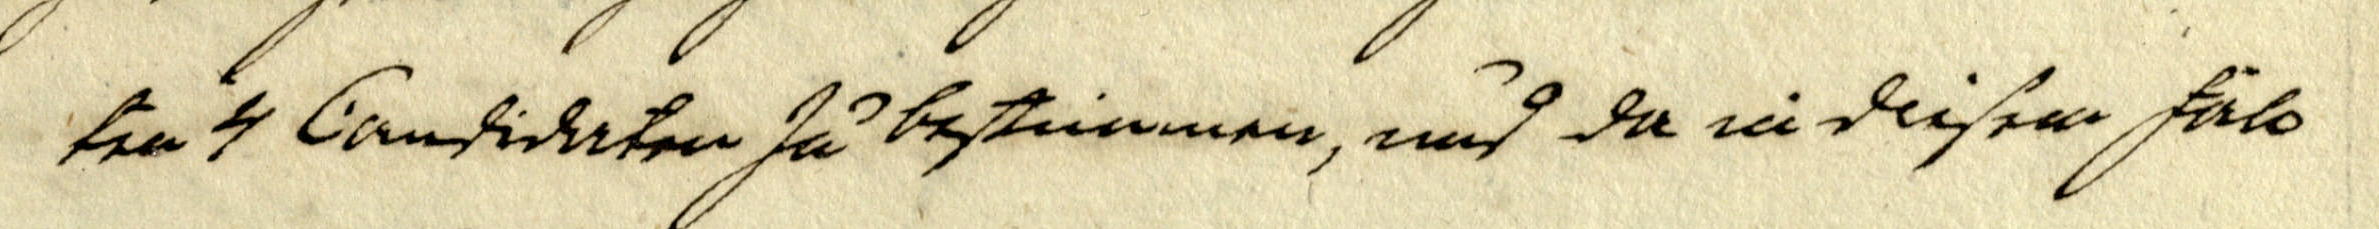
ten 4 Candidaten zu bestimmen, und da in diesem Fall
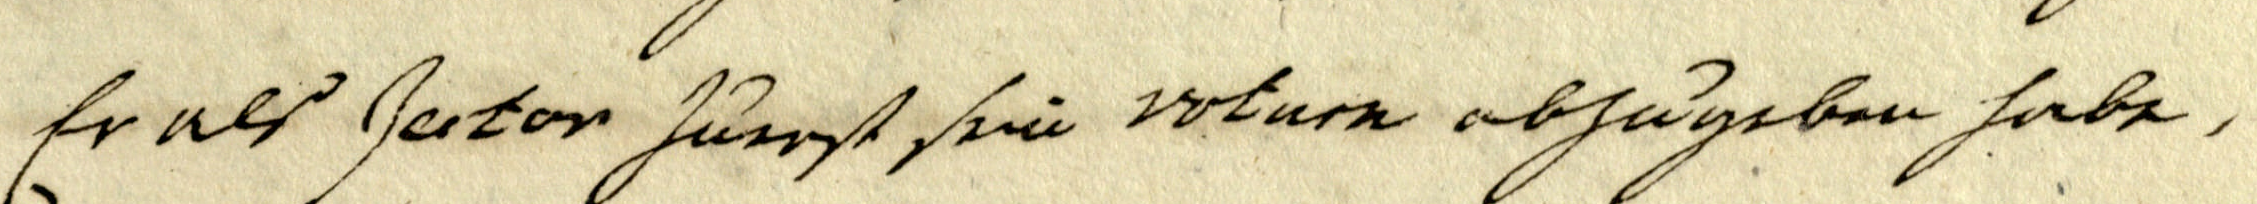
Er als Rector zuerst sein votum abzugeben habe,
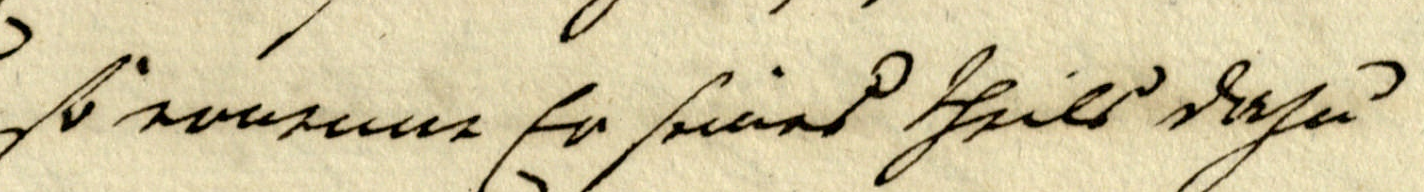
so ernenne Er seines Theils dazu
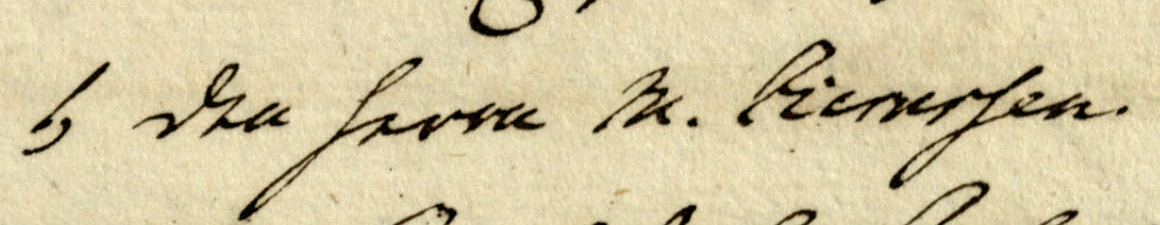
1, den herrn M. Ziemssen.
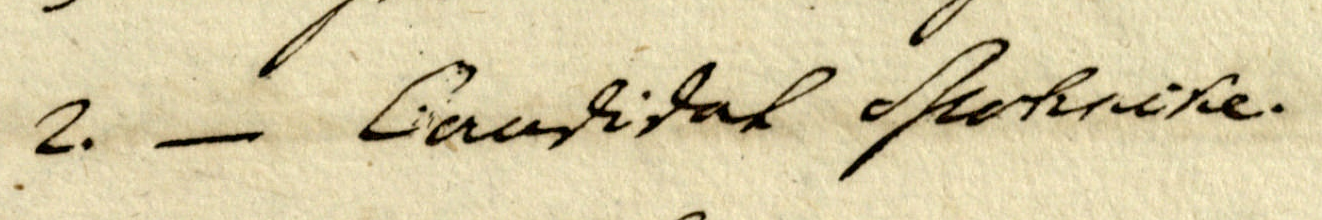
2. Candidat Mohnike.
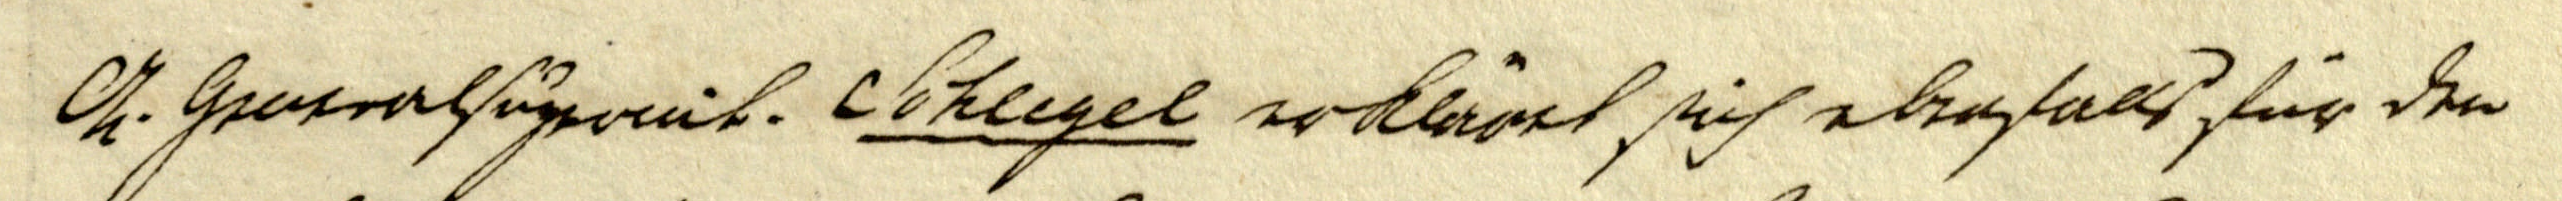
dh. Generalsuperint. Schlegel erklärt sich ebenfalls für den
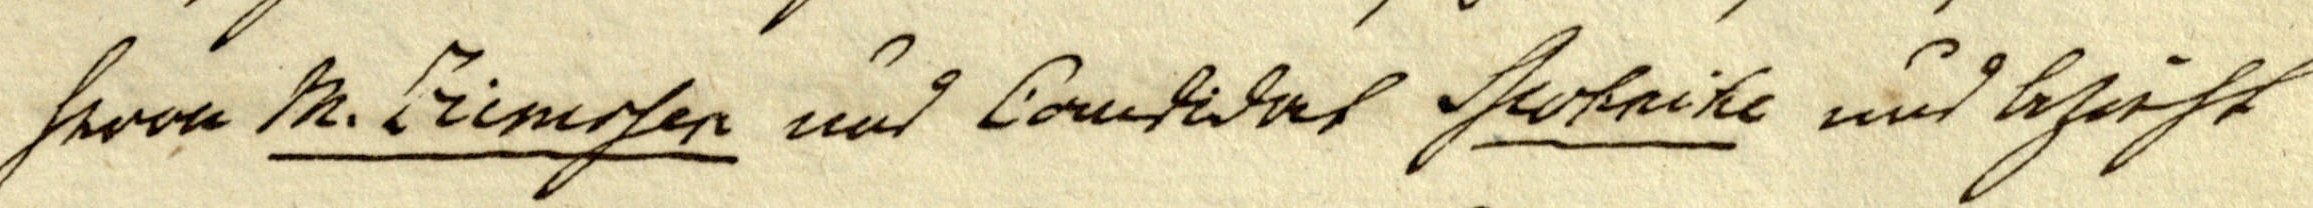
herrn M. Ziemssen und Candidat Mohnike und bezieht
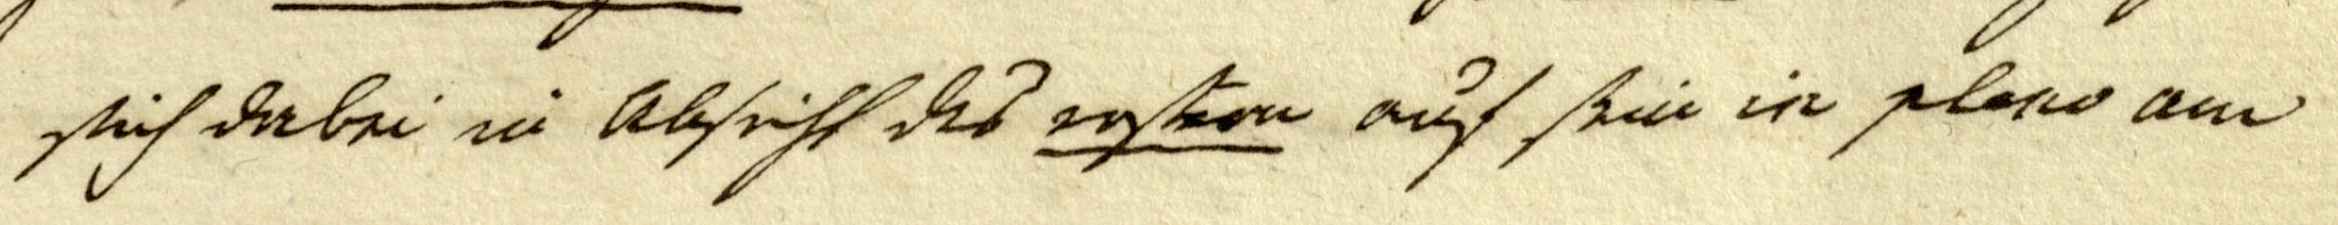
sich dabei in Absicht des erstern auf sein in pleno am
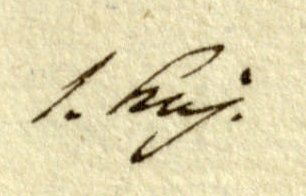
1. huj.
